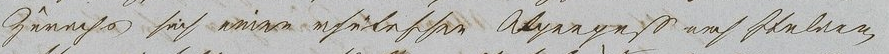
Zürichs sich einen rhätischenAlpenpaß nach Italien
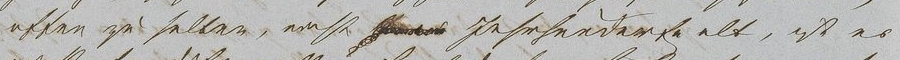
offen zu halten, nicht ... Jahrhunderte alt, ist es
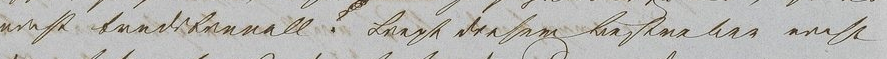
nicht traditionell? Liegt diesem Bestreben nicht
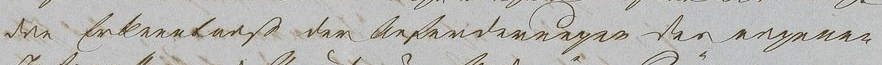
die Erkenntniß der Anforderungen des eigenen
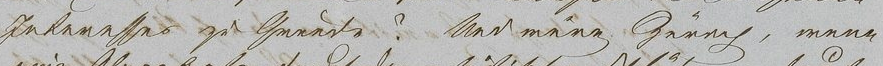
Interesses zu Grunde? Und wäre Zürich, wenn
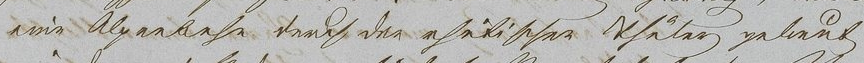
eine Alpenbahn durch die rhätischen Thäler gebaut
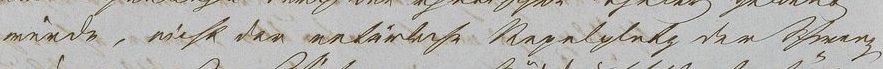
würde, nicht der natürliche Stapelplatz der Schweiz
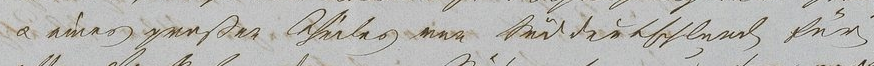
& eines großen Theiles von Deutschland für
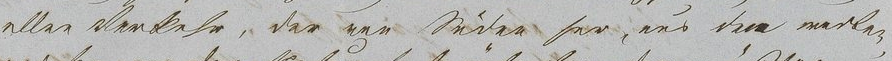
allen Verkehr, der von Süden her, aus dem weitern,
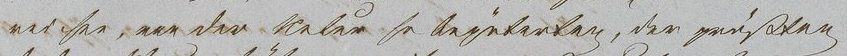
reichen, von der Natur so begüterten, der größten
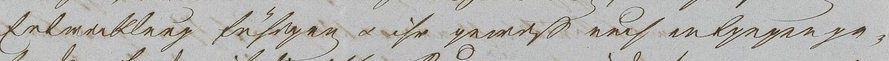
Entwicklung fähigen & ihr gewiß auch entgegen ge-
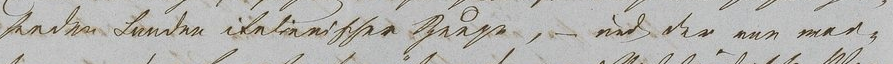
henden Landen italienischer Zunge, – und der von wei-
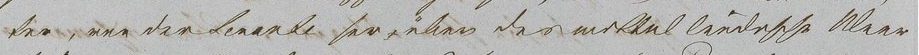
ter, von der Levante her, über das mittelländische Meer
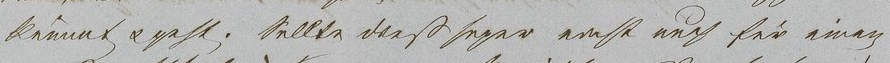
kömmt & geht. Sollte dieß sogar erst auch für einen
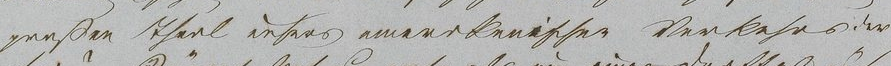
großen Theil unsers amerikanischen Verkehrs der
